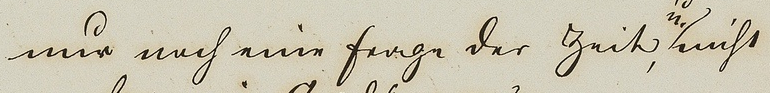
nur noch eine Frage der Zeit, u. nicht
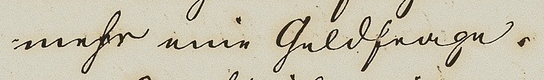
mehr eine Geldfrage.
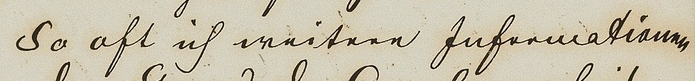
So oft ich weitere Informationen
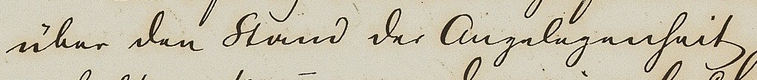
über den Stand der Angelegenheit
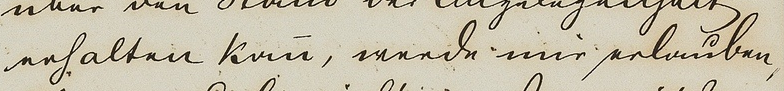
erhalten kannn, werde mir erlauben,
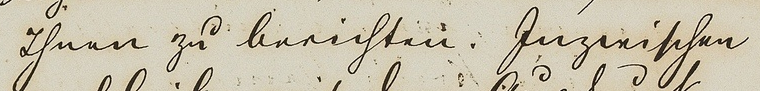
Ihnen zu berichten. Inzwischen
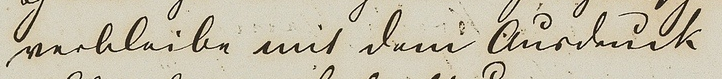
verbleibe mit dem Ausdruck
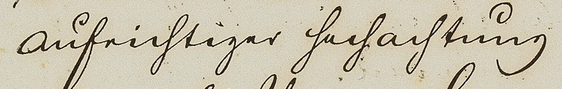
aufrichtiger Hochachtung
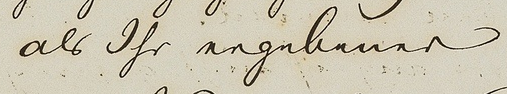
als Ihr ergebener
